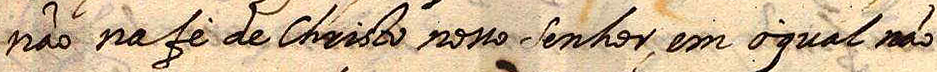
não na fe de Christo nosso senhor, em o qual não
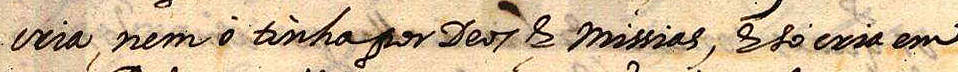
cria, nem o tinha por Deos, E missias, E so cria em
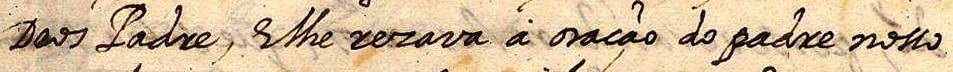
Deos Padre, E lhe rezava a oração do padre nosso
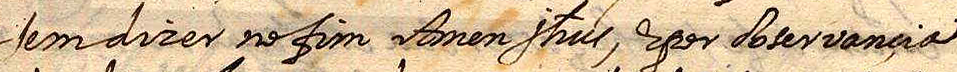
sem dizer no fim Amen jh̄sus, E por observançia
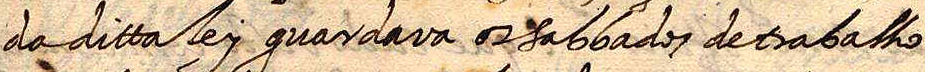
da ditta ley guardava os sabbados de trabalho
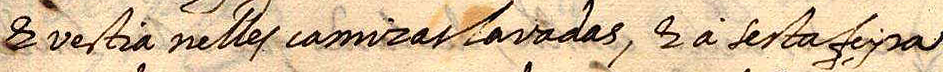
E vestia nelles camizas lavadas, E a sesta feyra
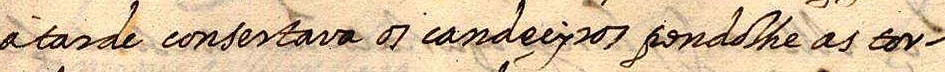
a tarde consertava os candeeyros pondolhes as tor
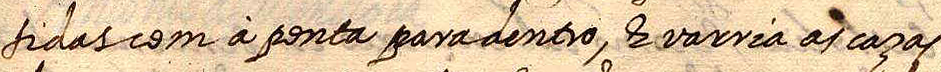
sidas com a ponta para dentro, E varria as cazas
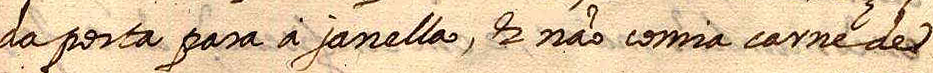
da porta para a janella, E não comia carne de
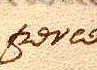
porco
